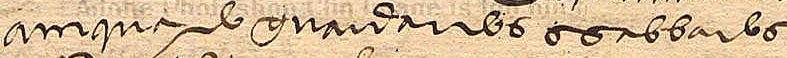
acerqua do guardar dos ssabbados
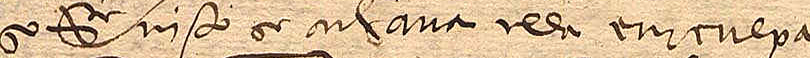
somte nisto se achaua ella em culpa
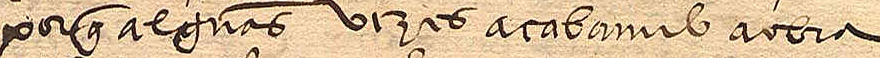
porq̅ algu̅as vezes acabamdo a obra
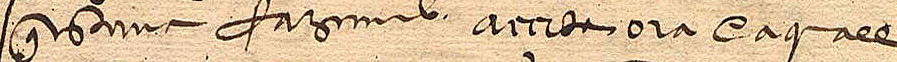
q̅ estaua fazemdo a çerta ora e a quall
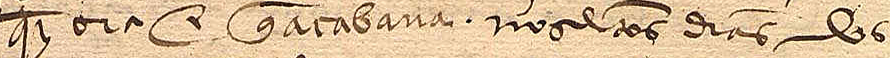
q̅r ora e̅ q̅ acabaua. nos dit̅os dias dos
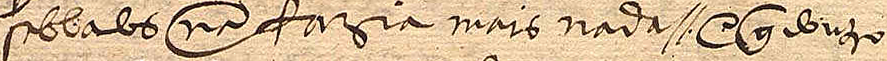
sabbados nā fazia mais nada //. e q̅ doutro
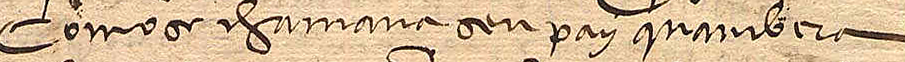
Como se chamaua seu pay quando era
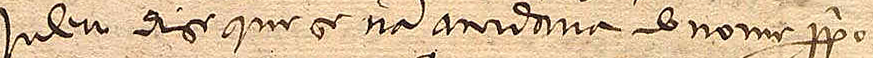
Judeu dise que se nā acordaua do nome ꝓp̄o
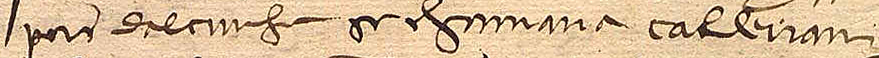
pore̅ dalcunha se chamaua caldeiram
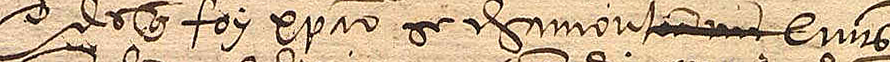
e des q̅ foy xpa̅o se chamou _ luiīs
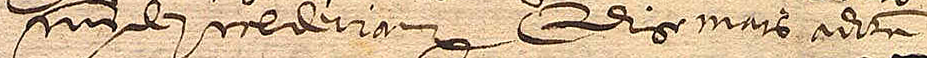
me̅dez caldeiram E dise mais a dit̅a
